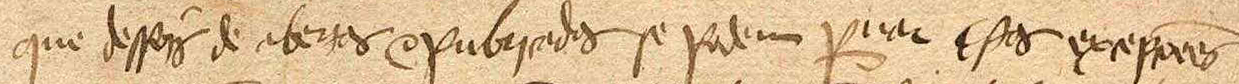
que despojs de abertas e pubrjcadas se podem ꝓuar Estas excepcõees
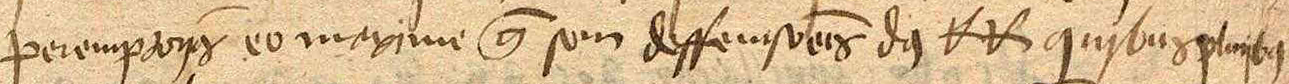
peremptorjas e o maxime q̄ som deffemsõees dꝯ RR qujbus plurjbꝯ
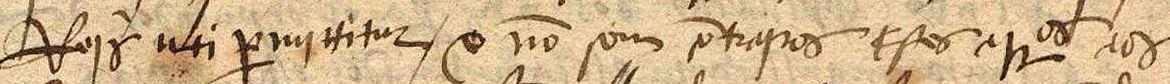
Rejs ulti ꝑmjttitur / e nō som c̄otrajros Estes artos aos
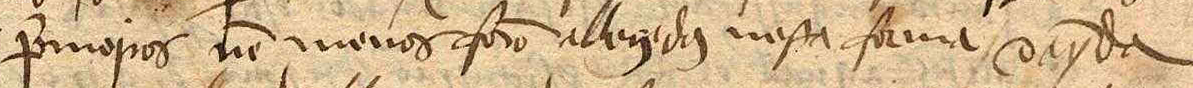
p̄mejros nē menos forō allegadꝯ nesta forma / e aȳda
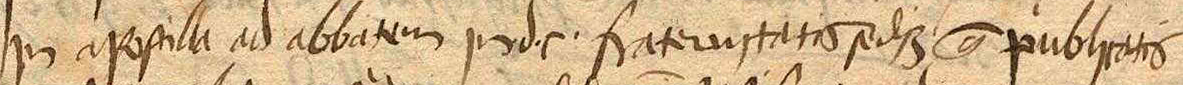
jn apostilla ad abbatem jn .d.c. fraternjtatis sedjs q̄ publjcatis
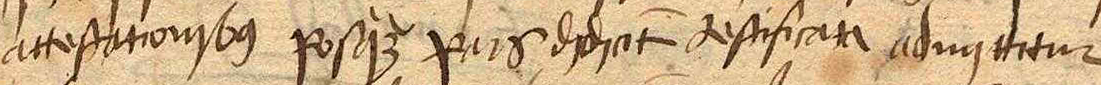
attestationjbꝯ posꝙ̄ pars djdjcit testificata admjttitur
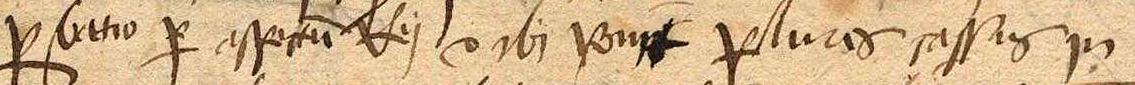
ꝓbatio ꝑ aspectū Rej e ibi ponjt plures cassus jn
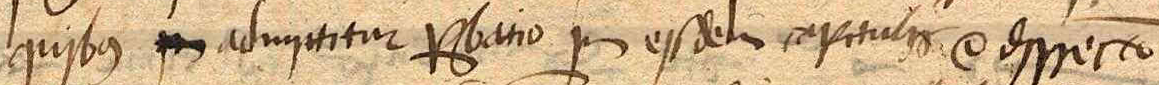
qujbꝯ jn admjttitur ꝓbatio jn ejsdem capitulis e djrrec̄to
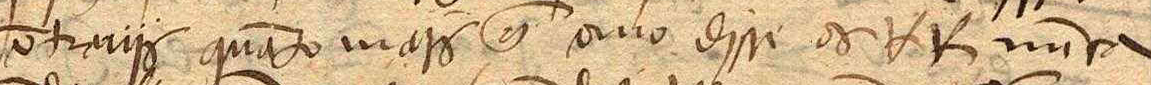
c̄otrarijs quāto majs q̄ como djsse os RR nūca
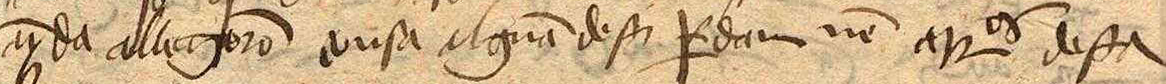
āyda allegar̄o cousa alguā desti ꝑdam nē artos desta
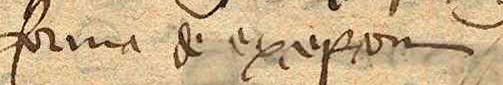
forma de excepcom //
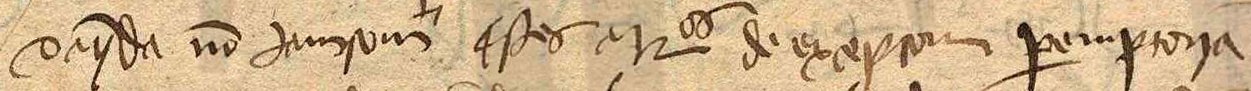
e aȳda n̄o tamsomte Estes artos de excepcom ꝑemptorja
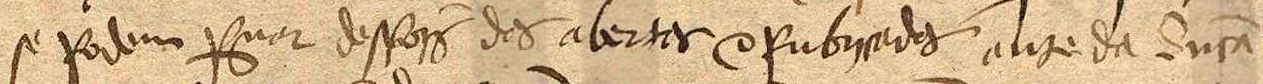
se podem ꝓuar despojs das abertas e pubrjcadas ante da Snç̄a
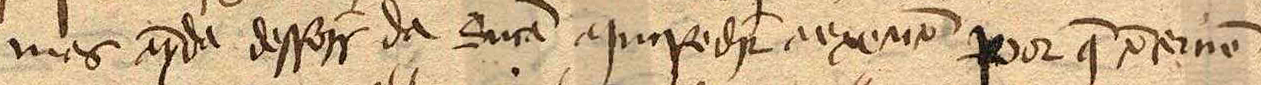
mas āyda despojs da Snçā a jmpedjr a execuc̄o porq̄ c̄ocernē
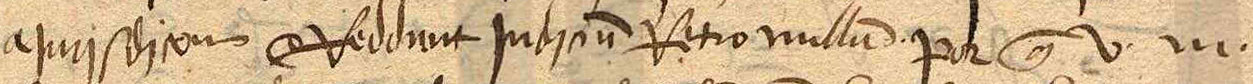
a jurjsdjcom e Reddunt Judjciū Retro nullū porq̄ v. m.
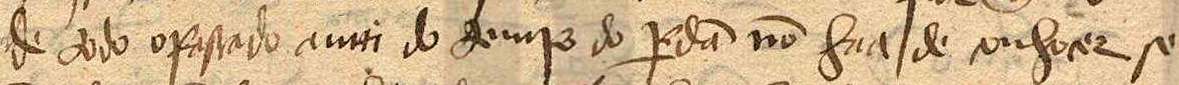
de todo o passado antti do tempo do ꝑdam nō haa de conhocer se
